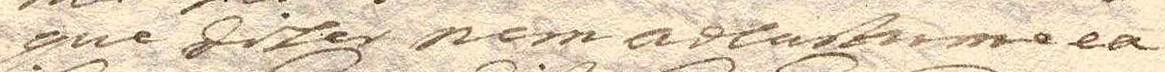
que dizer nem ao costume e a
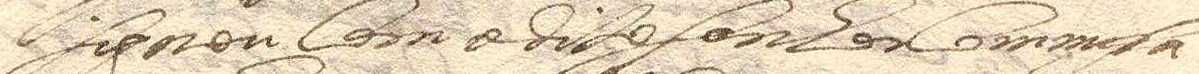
signou com o dito senhor Commisa
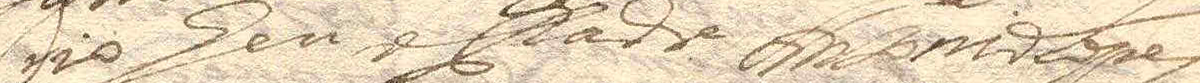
rio E eu o Padre Antonio Lopes
